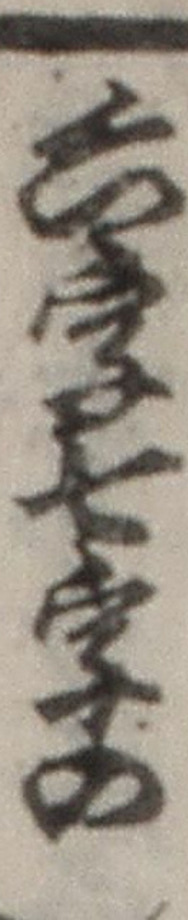六字七字の
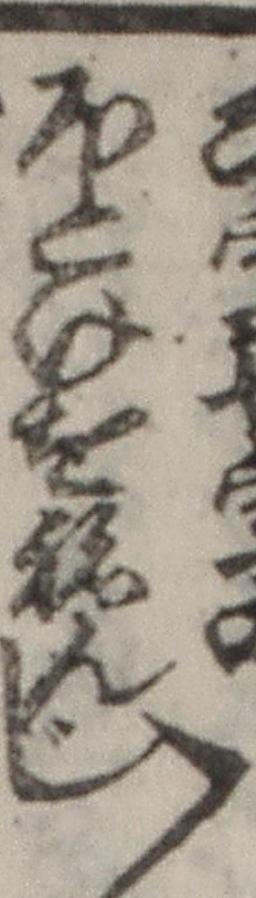ほとけをねんじ
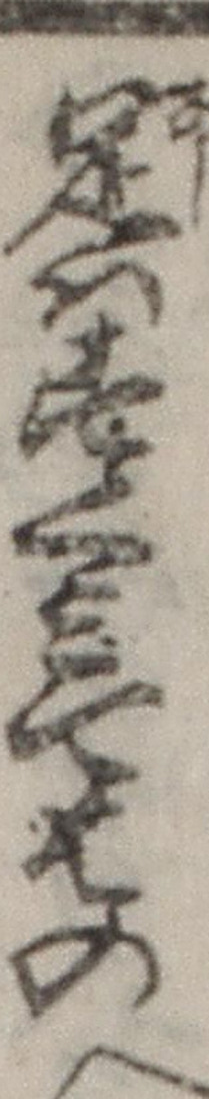足はすくみてはの
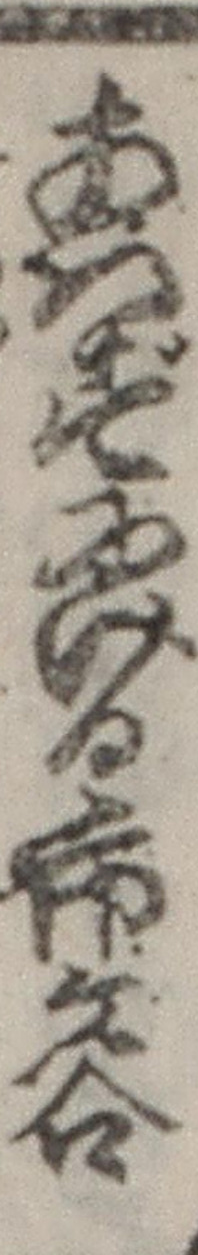あはずにける市ヶ谷
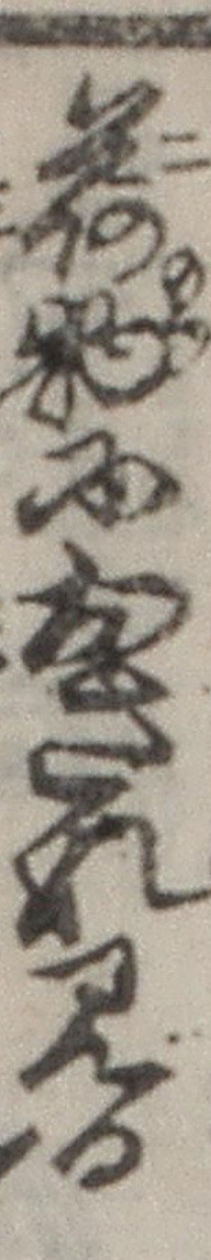荷物におされみる
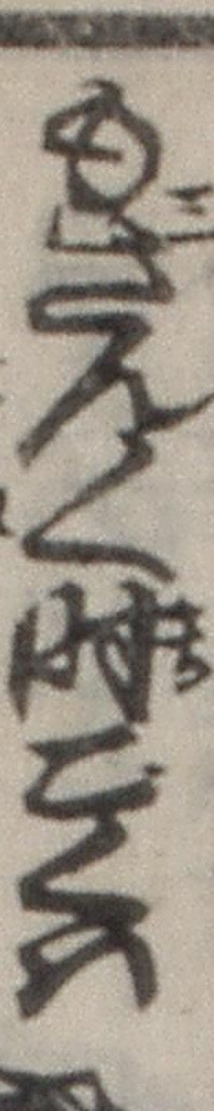もさん〳〵時こくは
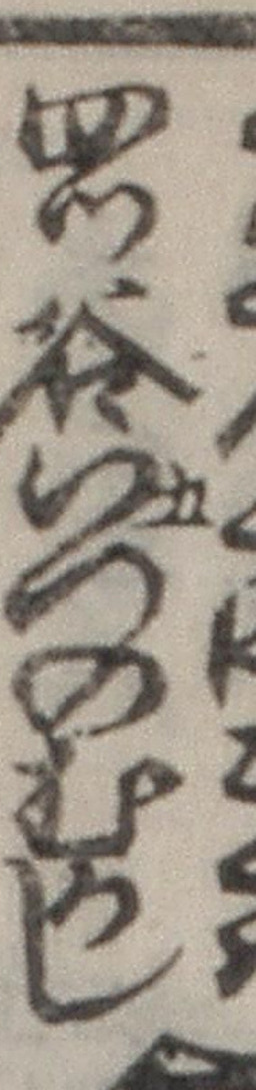四つ谷いつのむかし
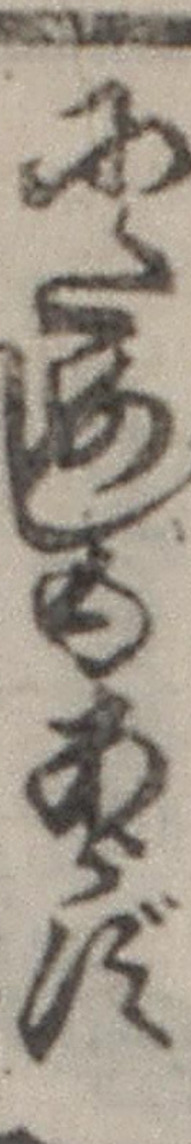にためしもあらず
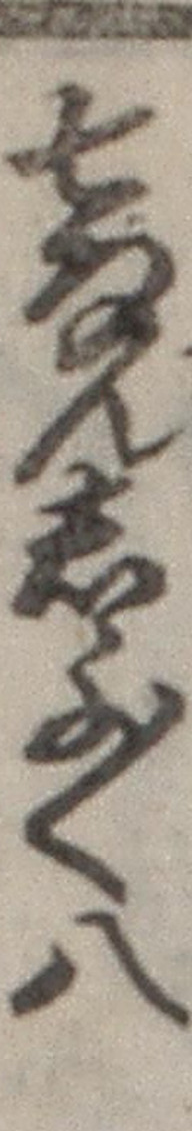七なんしよ〳〵八
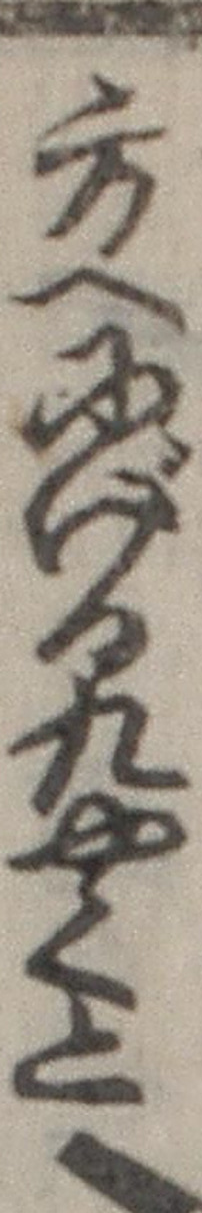方へにげる九やくと
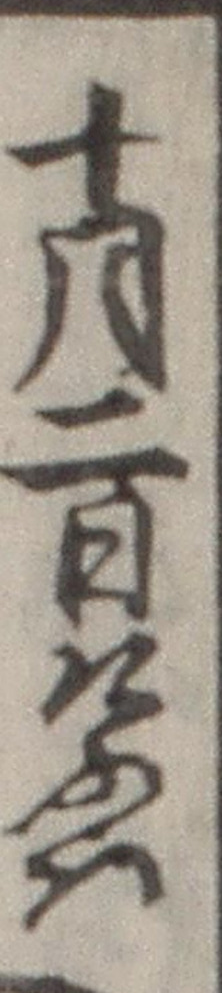十月二日けふは
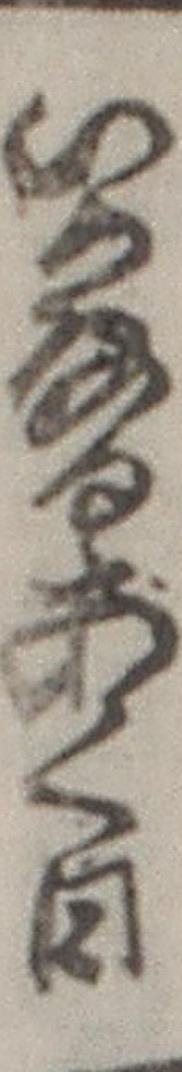いかなるあく日
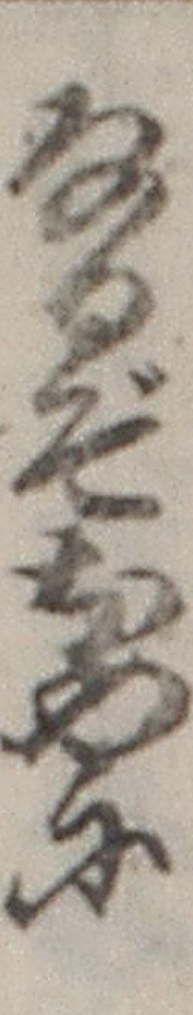なるぞおやに
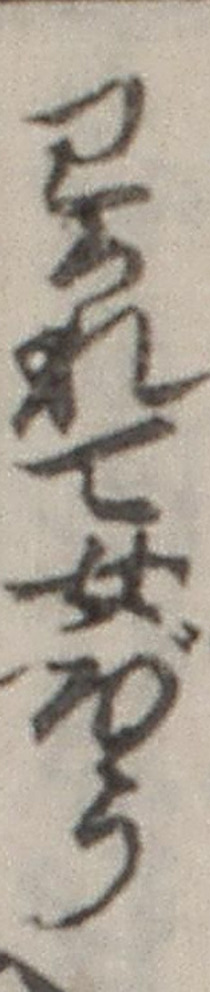わかれて女ぼう
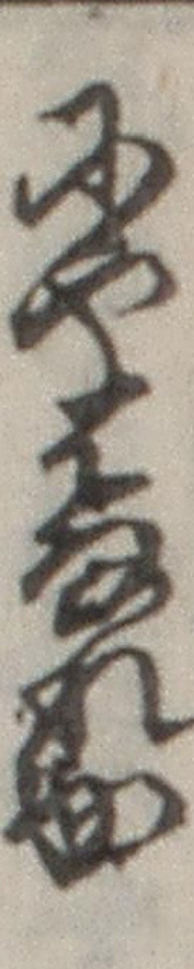にやはなれか
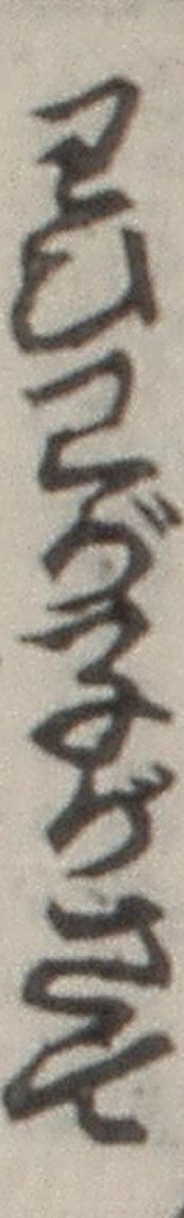わひわが子がさて
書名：安政二卯年　江戸大地震并出火附
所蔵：東京大学地震研究所図書室 Earthquake Research Institute Library, The University of Tokyo, JAPAN
